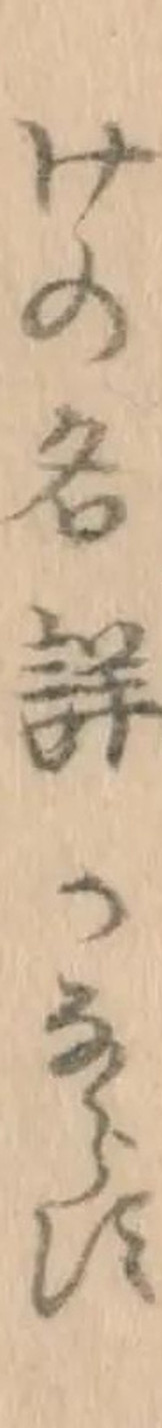けの名詳かならす

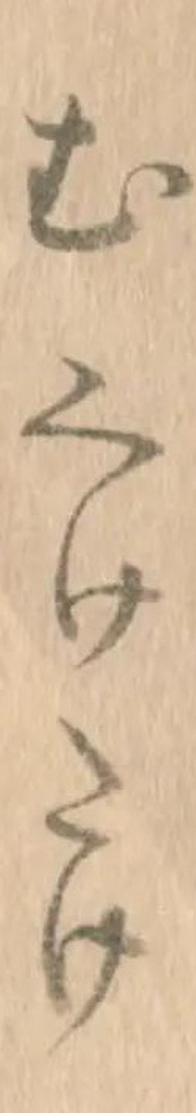むくけたけ
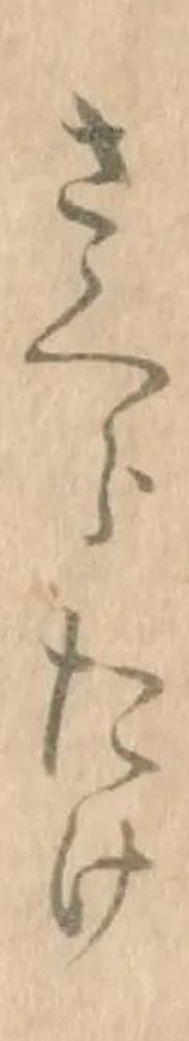さくらたけ
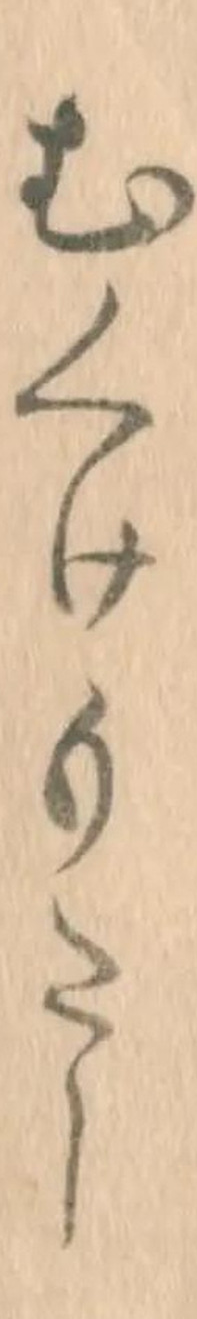むくけもたし
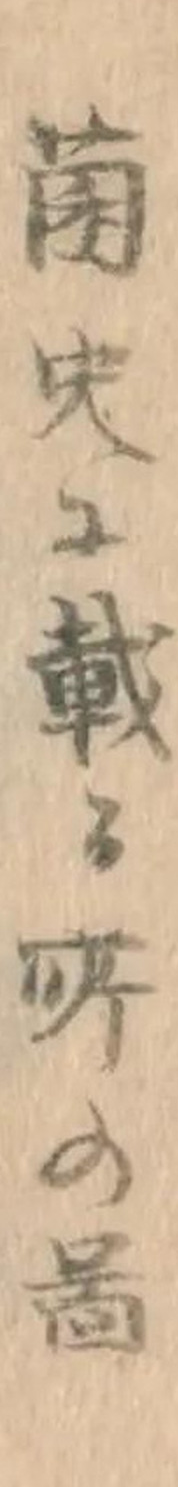菌史に載る所の図
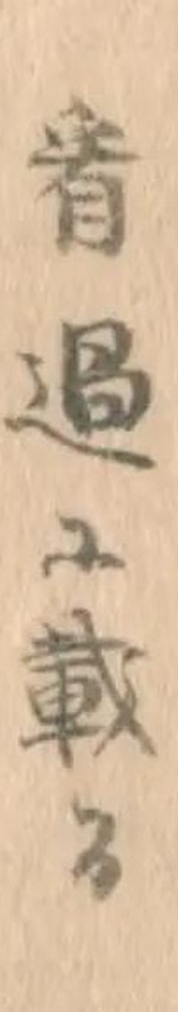看過に載る
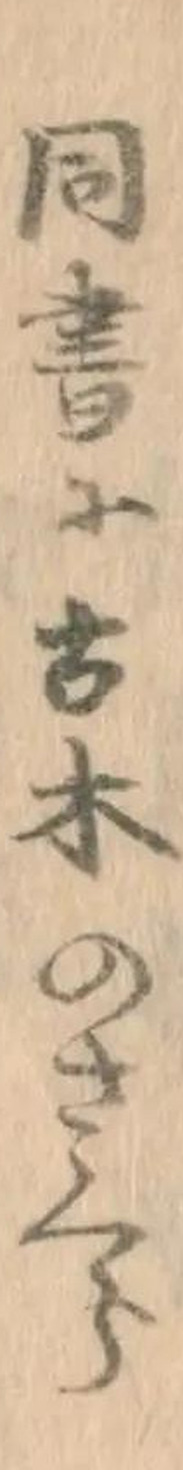同書に古木のさくら
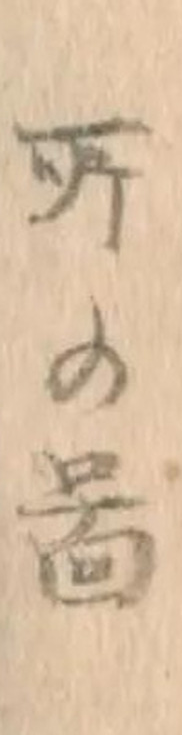所の図
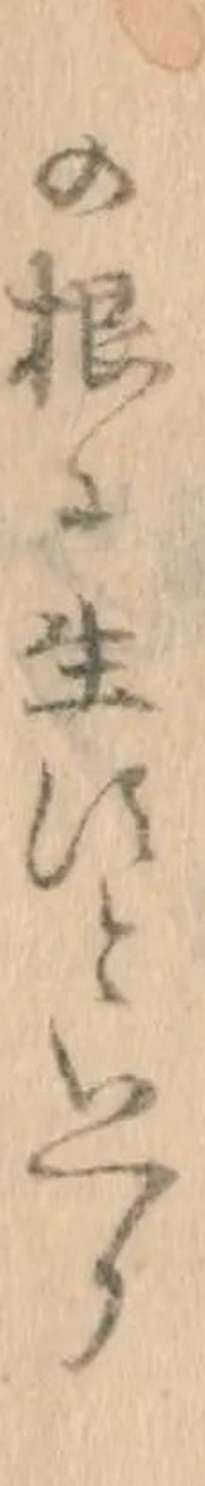の根に生すといへり
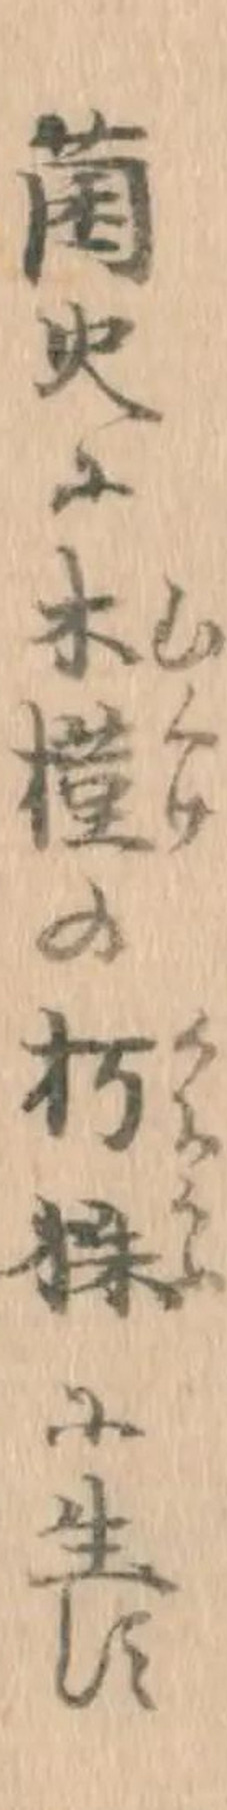菌史に木槿の朽株に生す
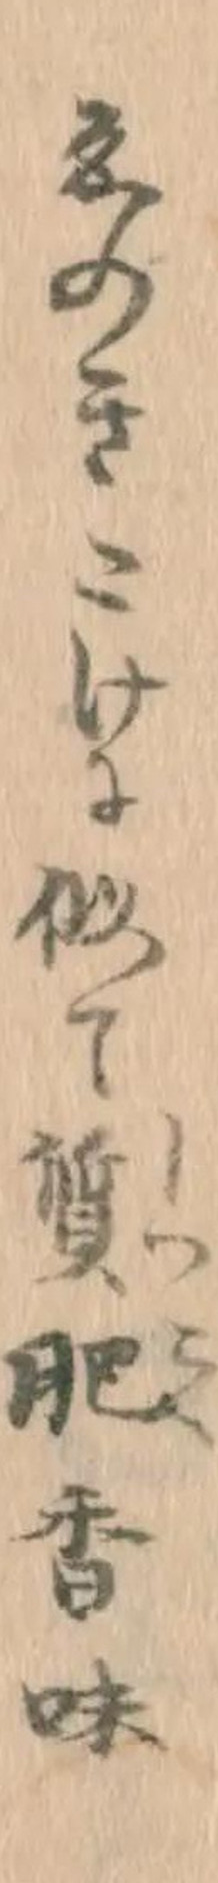ゑのきたけに似て質肥香味
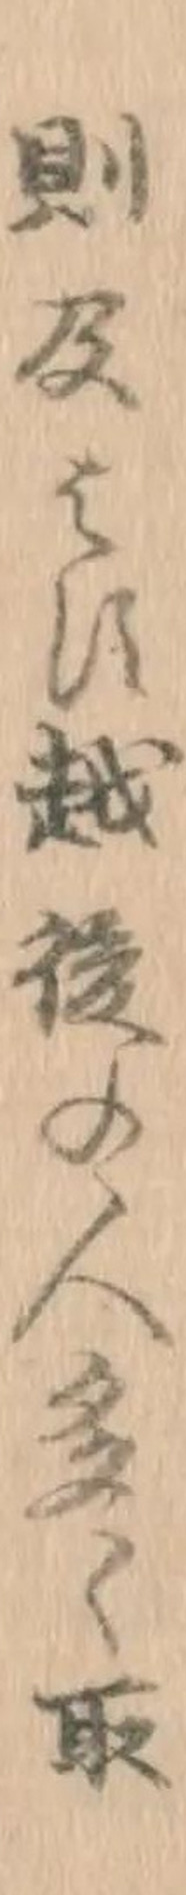則及はす越後の人多く取
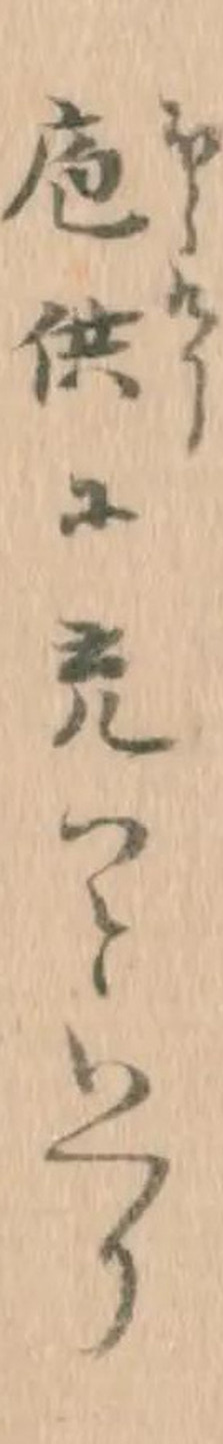庖供に充つといへり
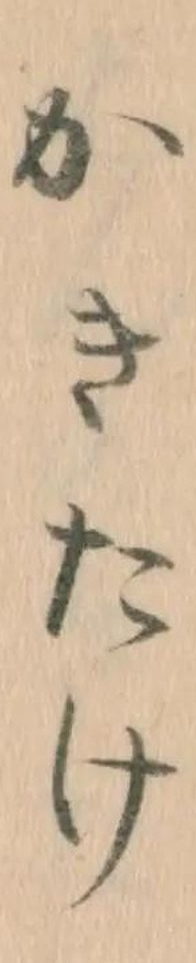かきたけ
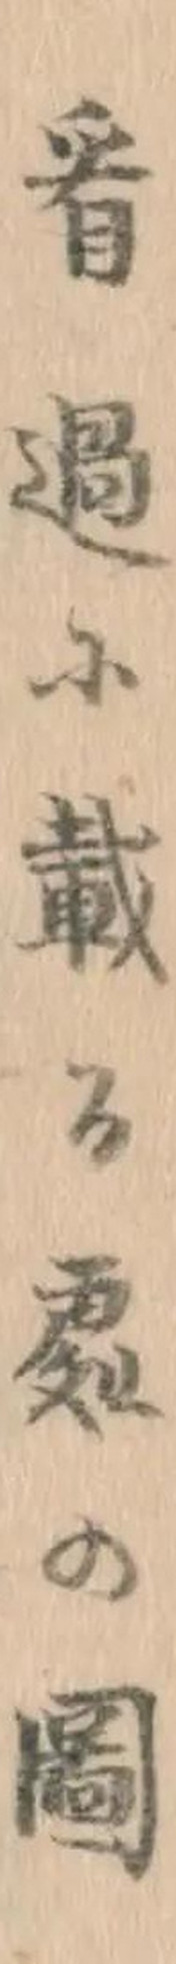看過に載る処の図
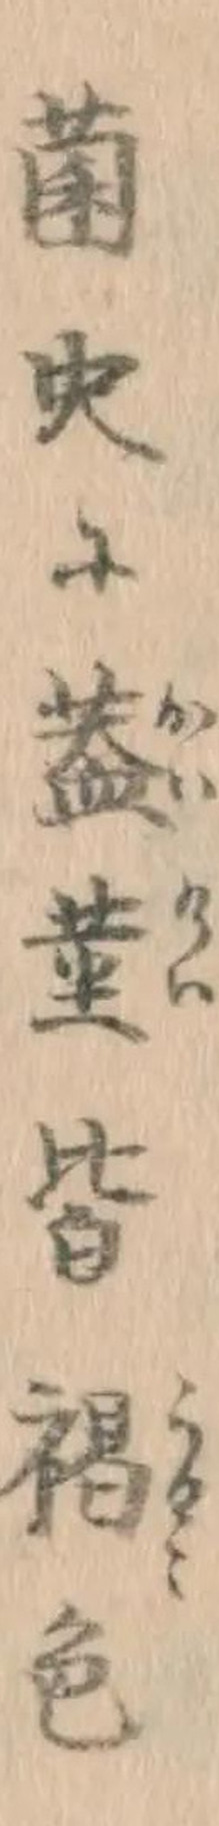菌史に蓋茎皆褐色
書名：本草図譜. 巻55-57
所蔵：国立国会図書館 National Diet Library, JAPAN
